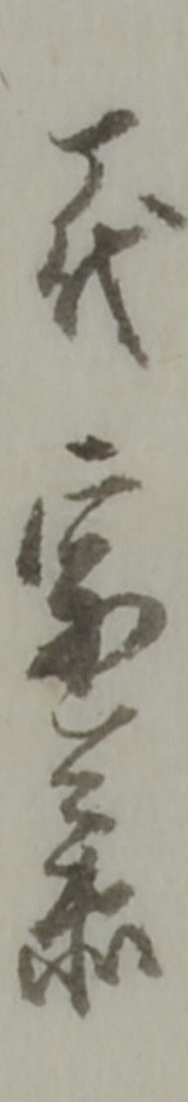丁代宗兵衛
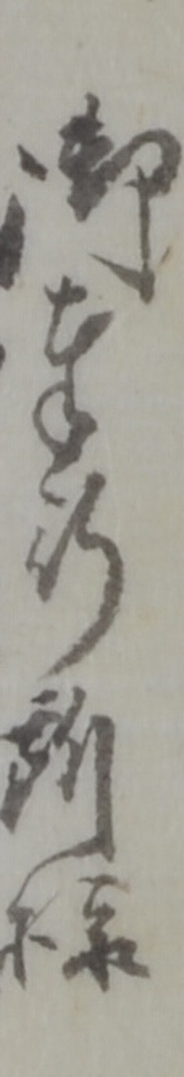御奉行所様
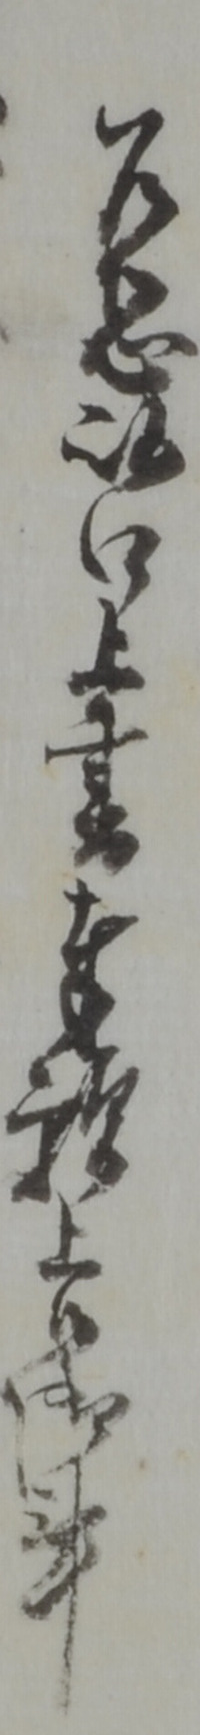乍恐以口上書奉願上候御事
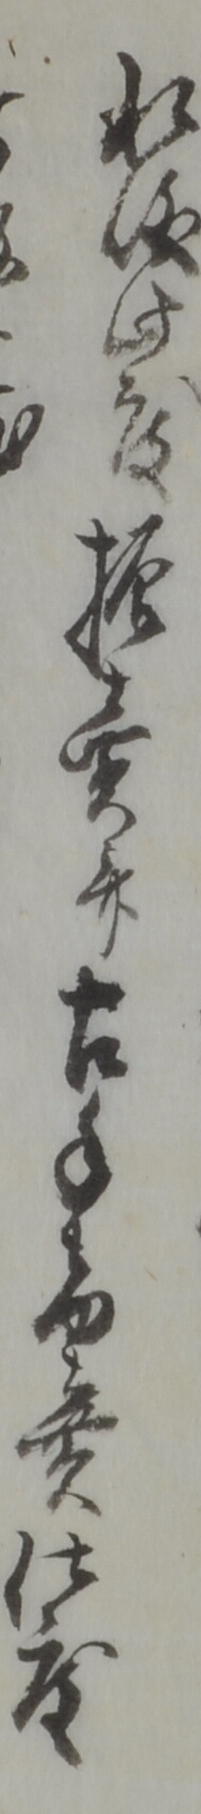私儀此度振売幷右手商売仕度
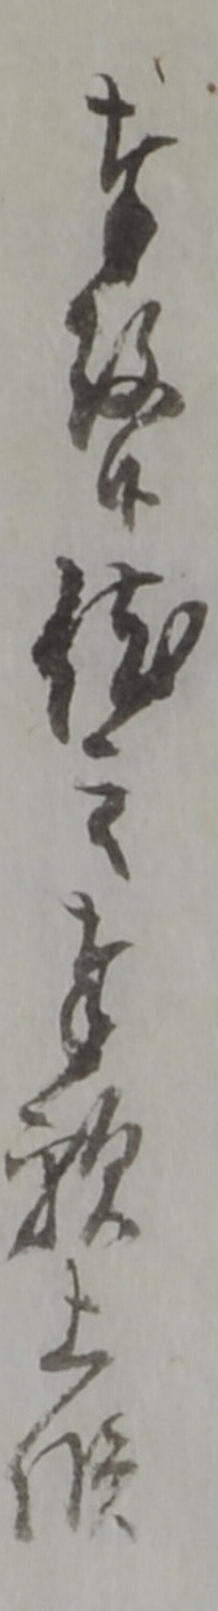奉存候依之奉願上候
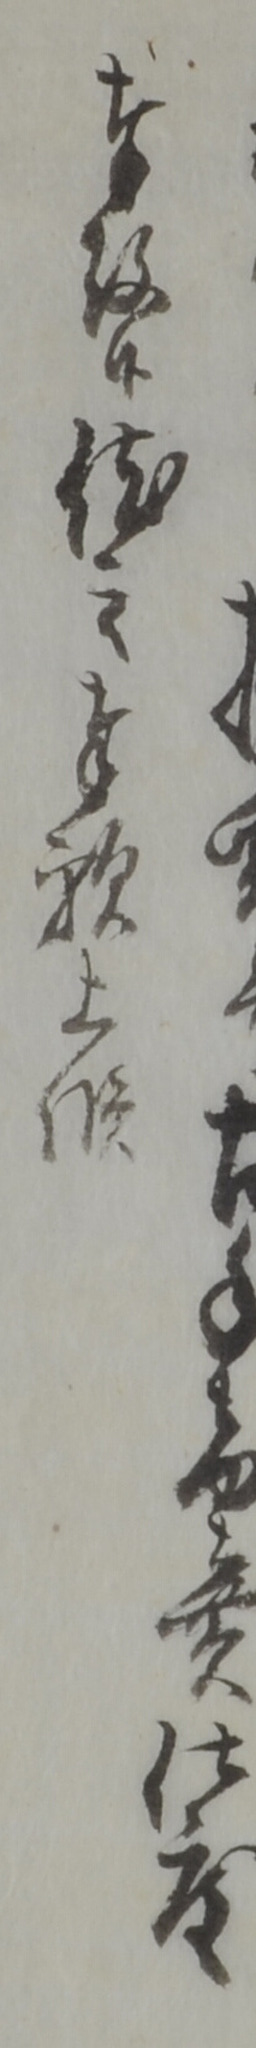奉存候依之奉願上候
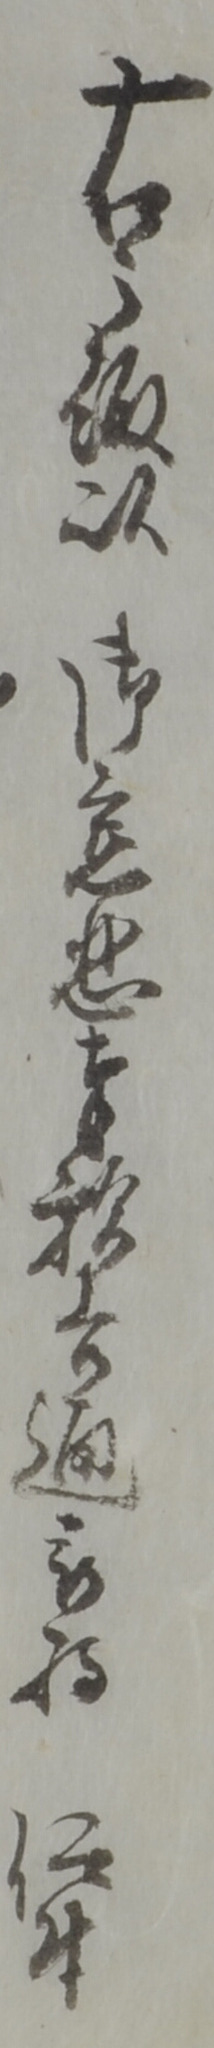右之趣以御慈悲奉願上候通被為仰付
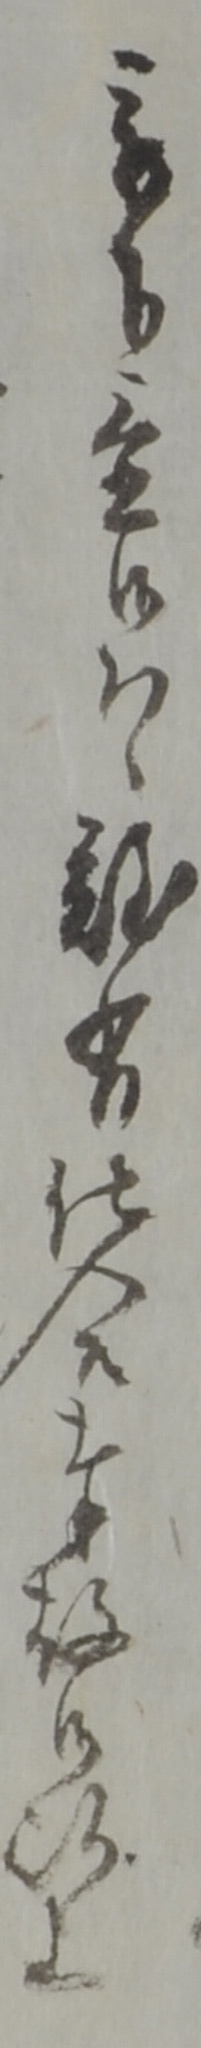被下置候ハヽ難有仕合奉存候以上
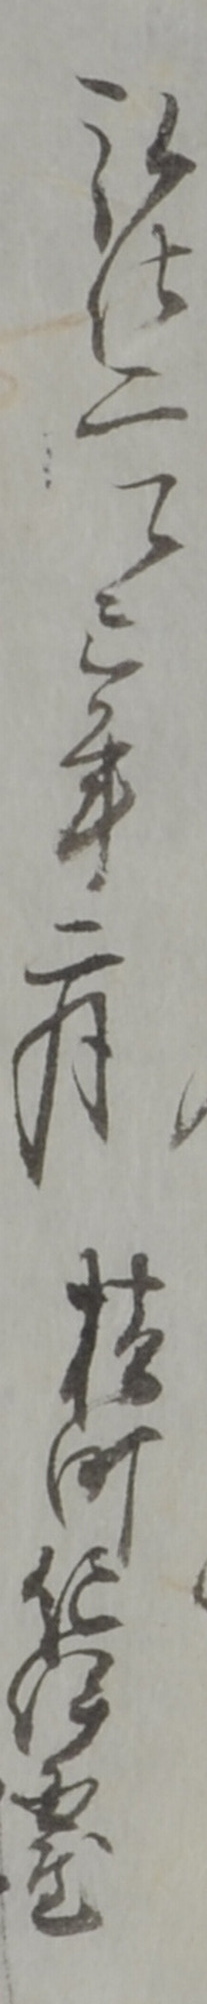弘化二乙巳年二月横町紀伊国屋
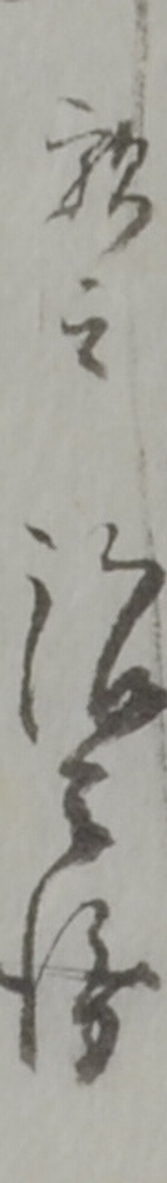願主治兵衛
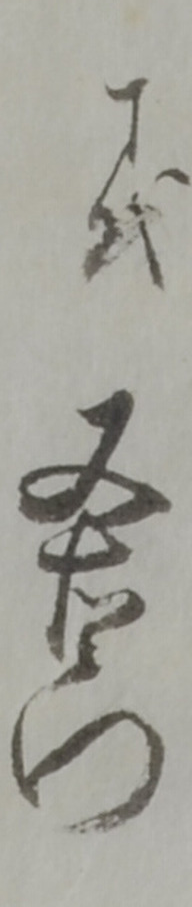丁代又右衛門
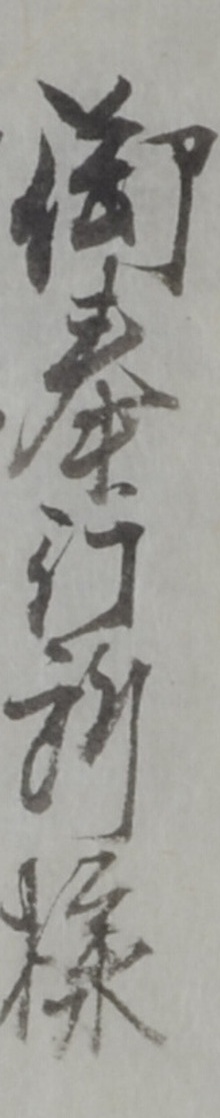御奉行所様

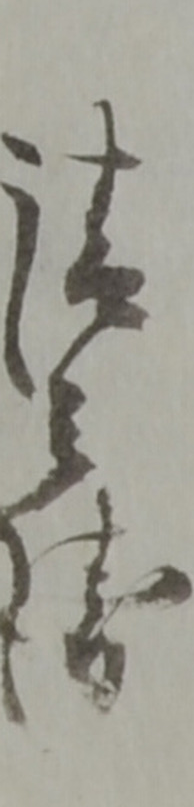清兵衛
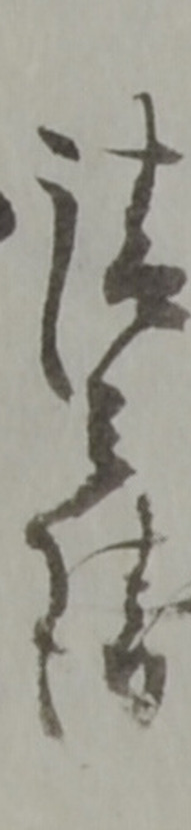清兵衛
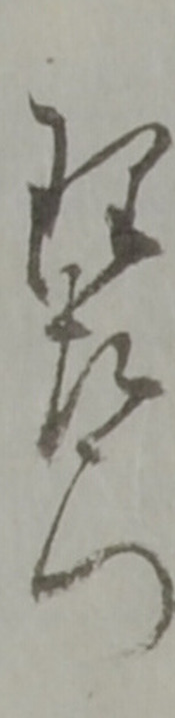理左衛門
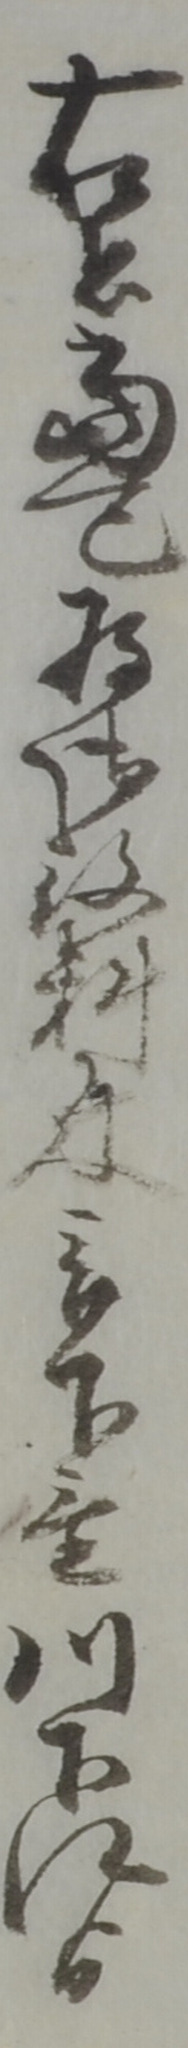右者当巳為御役料米被下置川下郷ゟ
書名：諸願書控簿
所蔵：伊那市立高遠町図書館・合同会社AMANE
